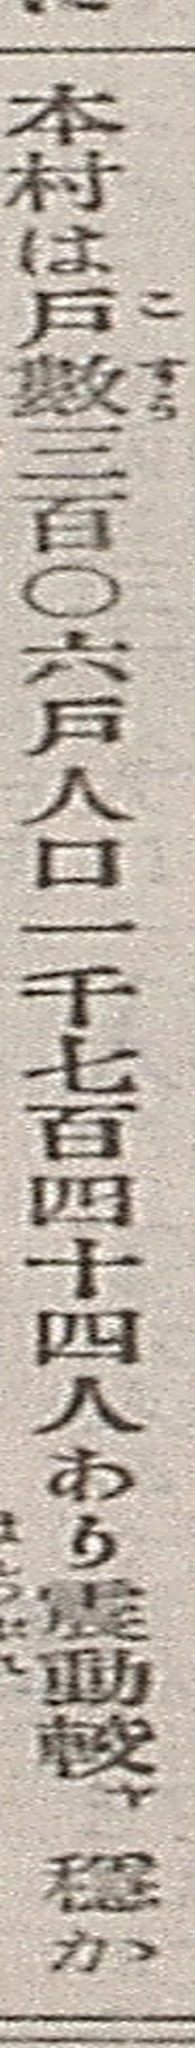本村は戸数三百〇六戸人口一千七百四十四人あり震動軽き穏か
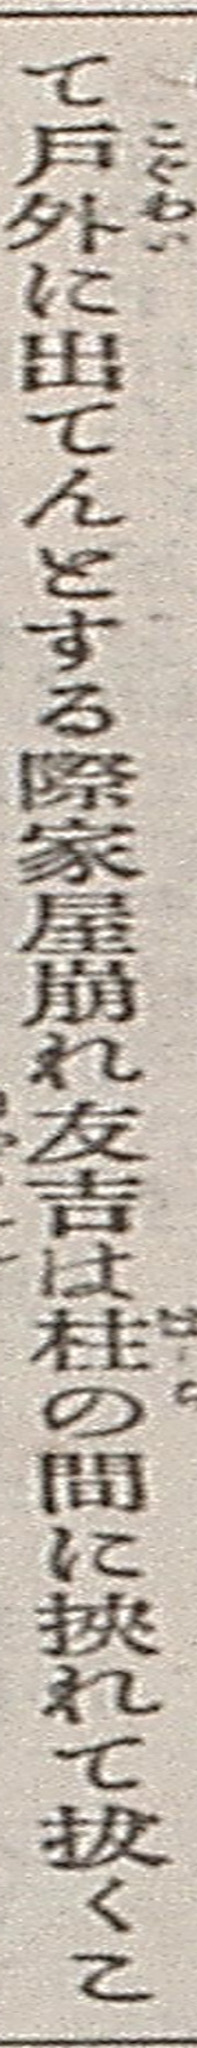て戸外に出てんとする斎家屋崩れ友吉は柱の間に挟れて抜くこ
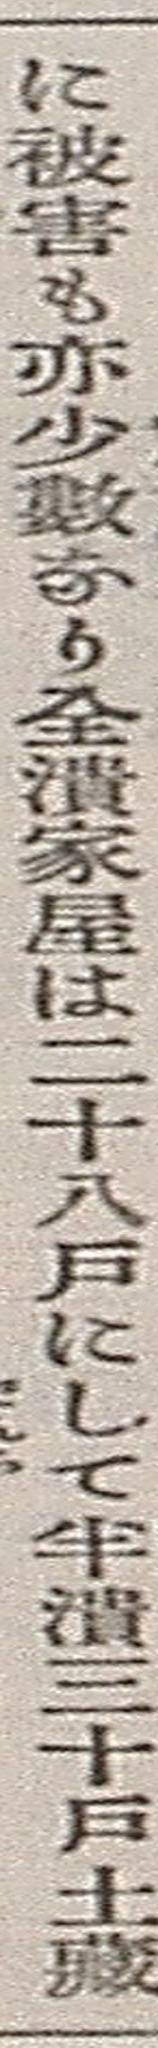に被害も亦少数なり全潰家屋は二十八戸にして半潰三十戸土蔵
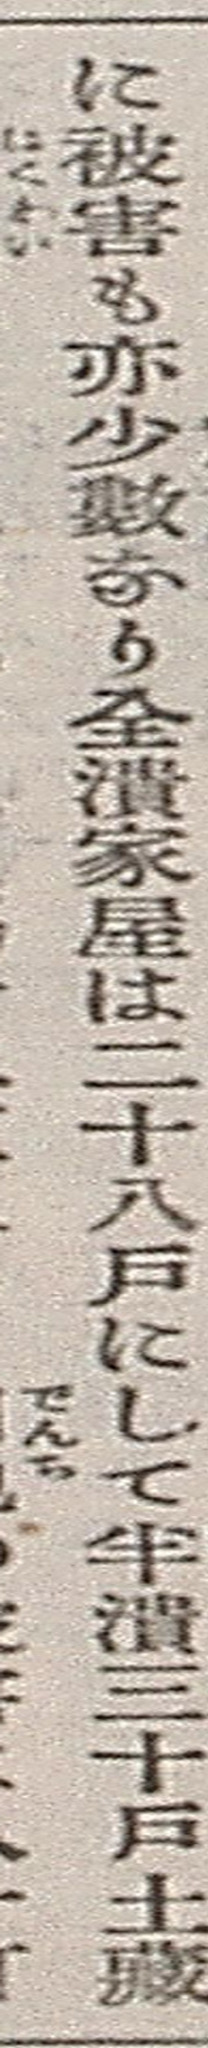に被害も亦少数なり全潰家屋は二十八戸にして半潰三十戸土蔵
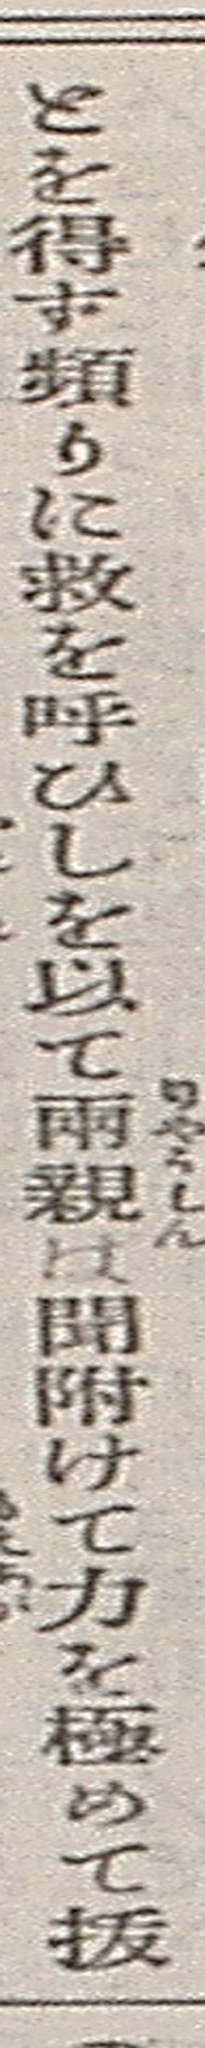とを得ず頻りに救を呼ひしを以て両親は聞附けて力を極めて抜
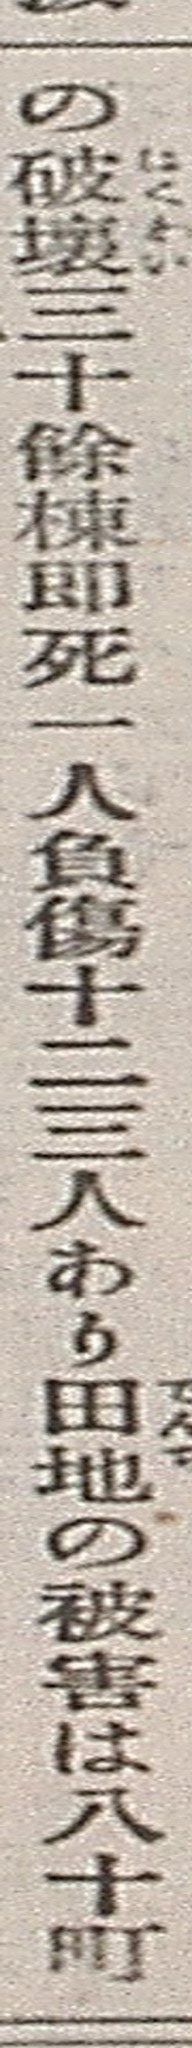の破壊三十余棟即死一人負傷十二三人あり田地の被害は八十町
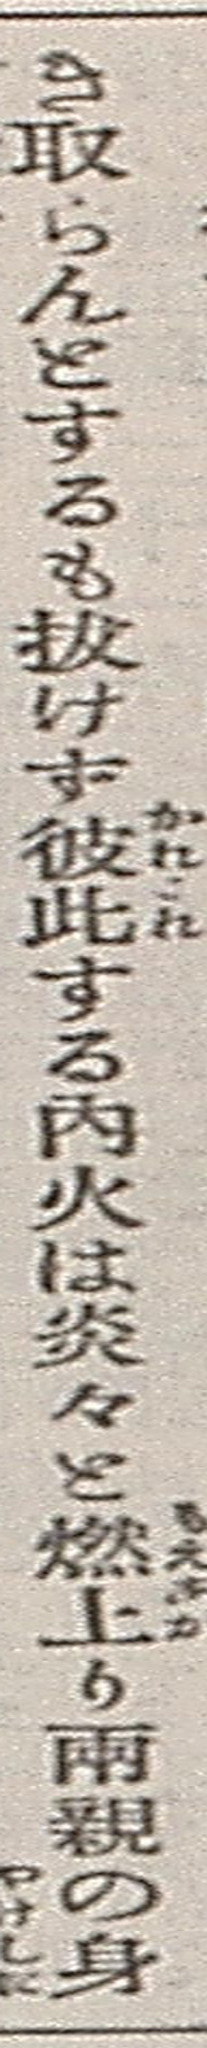き取らんとするも抜けず彼此する内火は炎々と燃上り両親の身
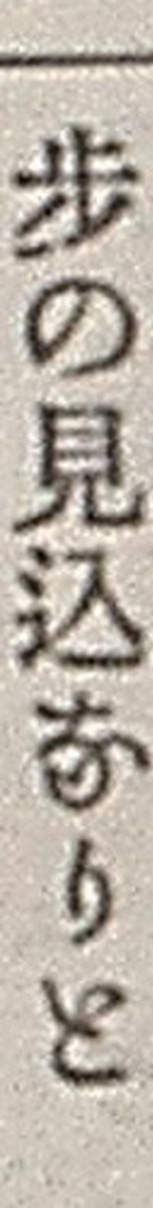歩の見込なりと
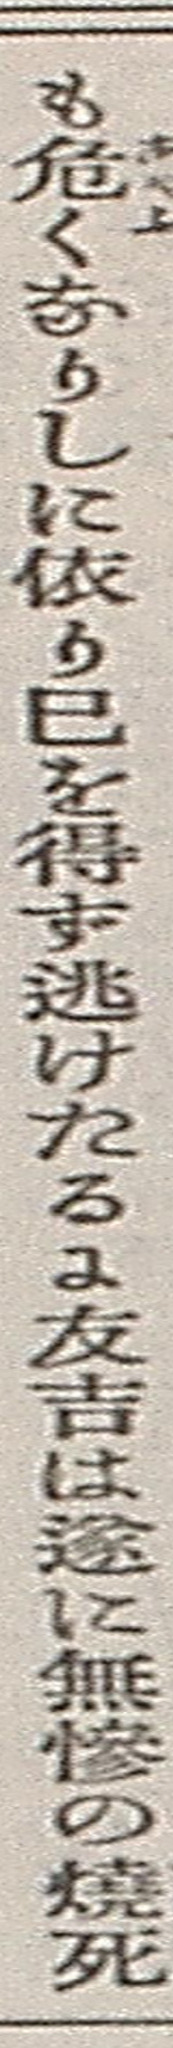も危くなりしに依り已を得ず逃けたるに友吉は遂に無惨の焼死
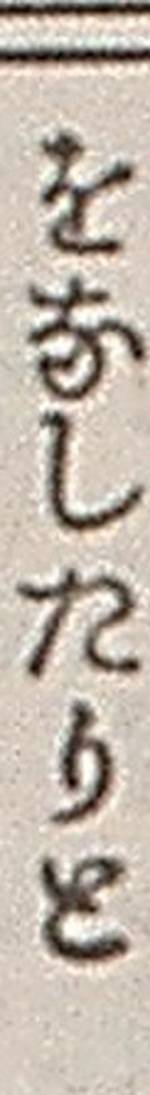をなしたりと
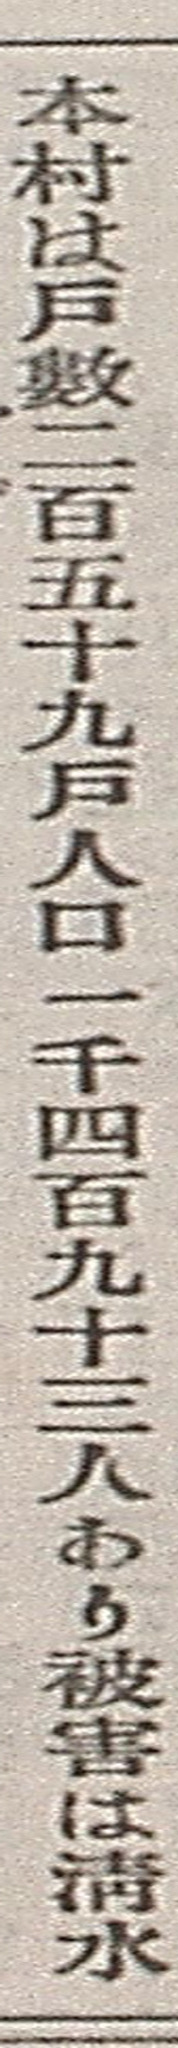本村は戸数二百五十九戸人口一千四百九十三人あり被害は清水
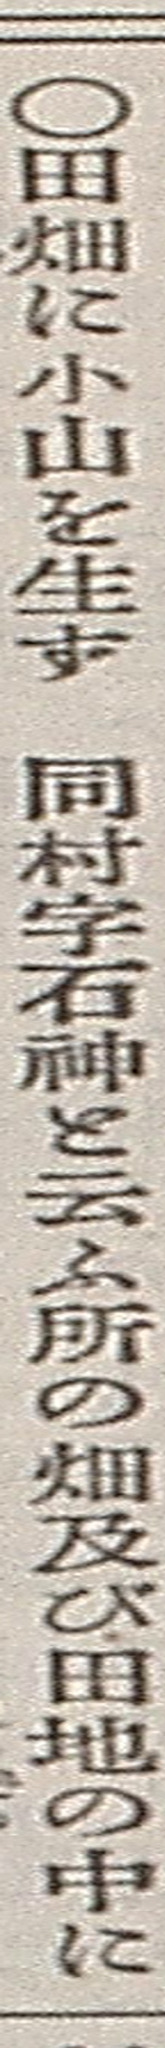〇田畑に小山を生ず同村字石神と云ふ所の畑及び田地の中に
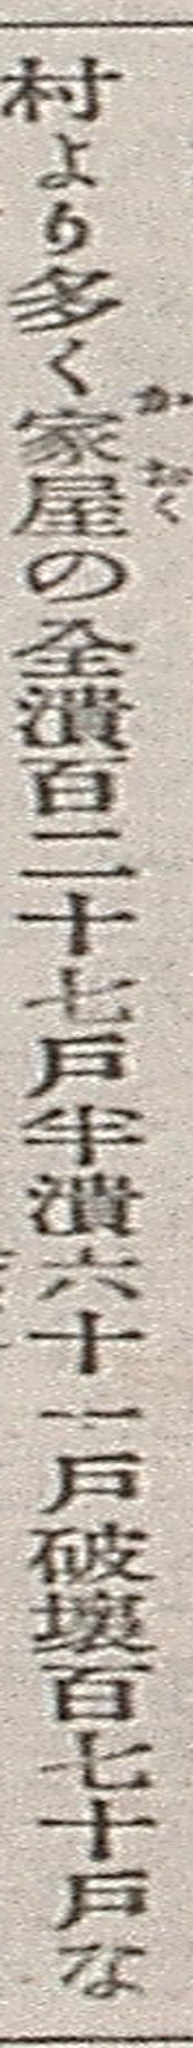村より多く家屋の全潰百二十七戸半潰六十一戸破壊百七十戸な
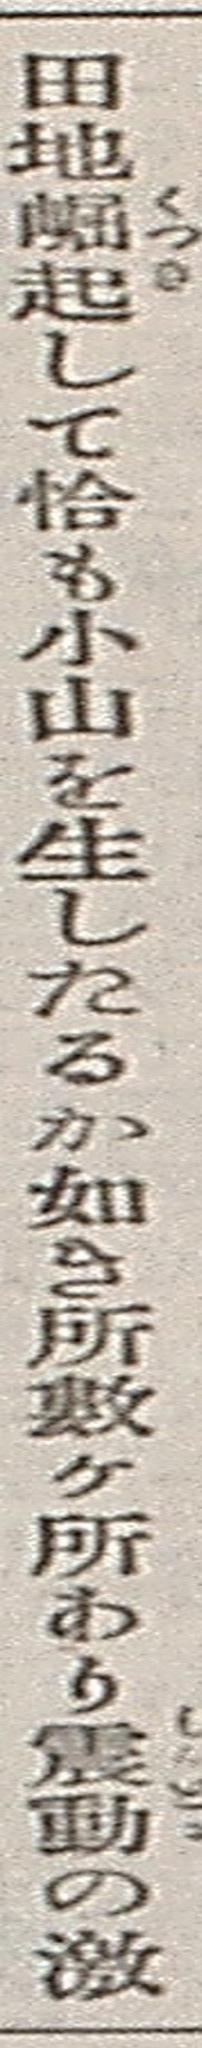田地崛起して恰も小山を生したるか如き所数ケ所あり震動の激
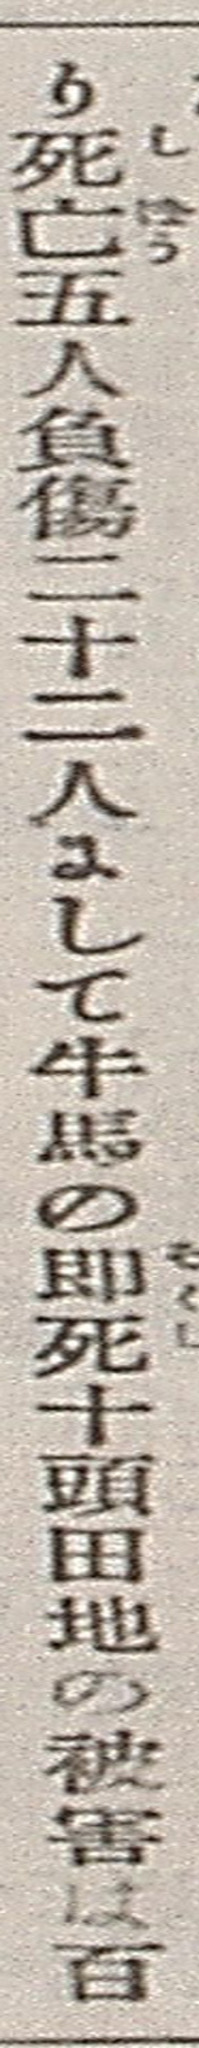り死亡五人負傷二十二人にして牛馬の即死十頭田地の被害は百
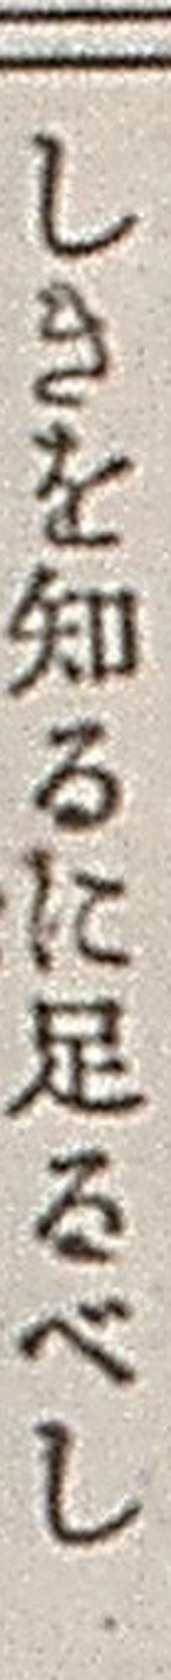しきを知るに足るべし
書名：風俗畫報臨時増刊第百二十四號　洪水地震被害録（上）
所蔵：東京大学地震研究所図書室 Earthquake Research Institute Library, The University of Tokyo, JAPAN
